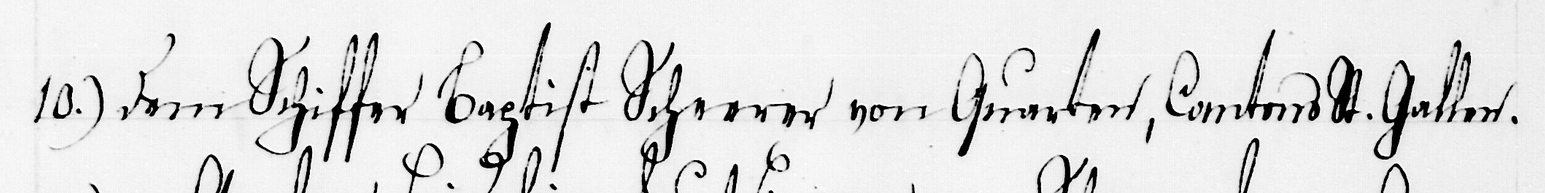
10.) Dem Schiffer Baptist Scheerer von Quarten, Cantons St. Gallen.
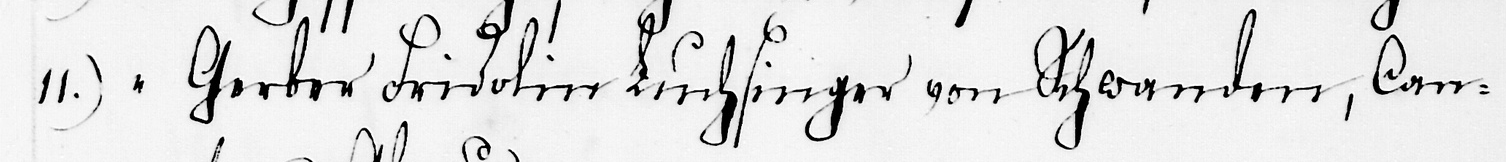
11.) “ Gerber Fridolin Luchsinger von Schwanden, Can¬
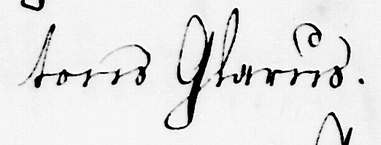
tons Glarus.
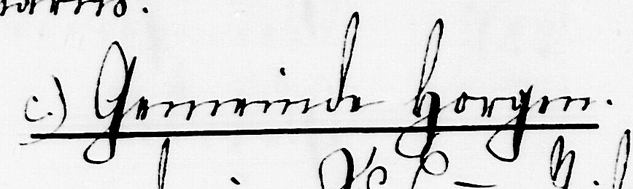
c. Gemeinde Horgen.
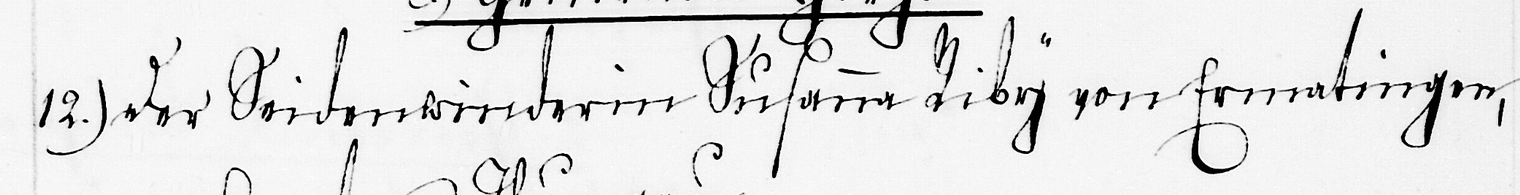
12.) Der Seidenwinderin Susanna Riby von Ermatingen,
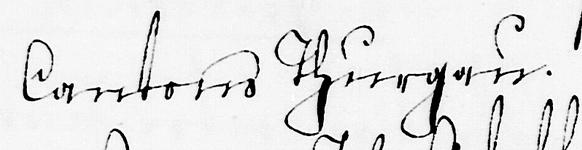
Cantons Thurgau.
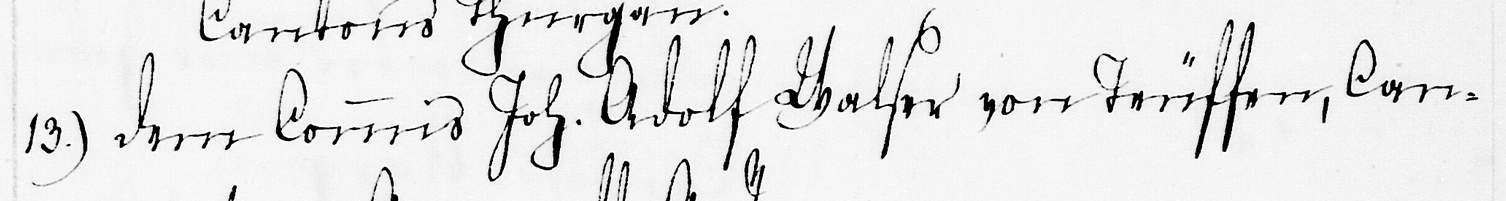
13.) dem Commis Joh. Adolf Walser von Teuffen, Can¬
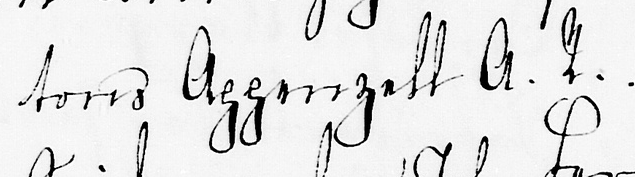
tons Appenzell A. R.
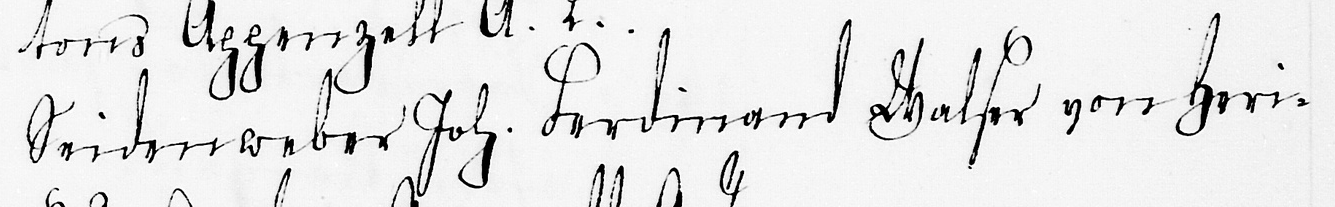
eidenweber Joh. Ferdinand Walser von Heri¬
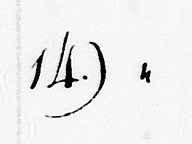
14.)
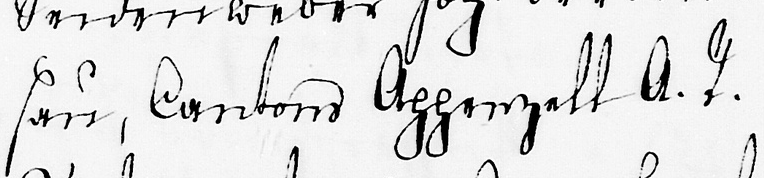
sau, Cantons Appenzell A. R.
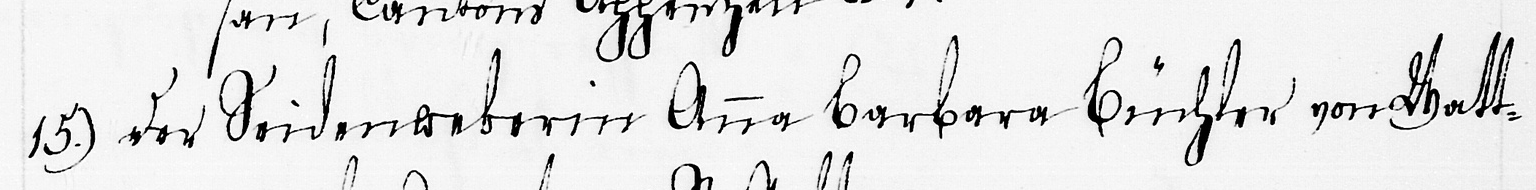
15.) Der Seidenweberin Anna Barbara Büchler von Watt¬
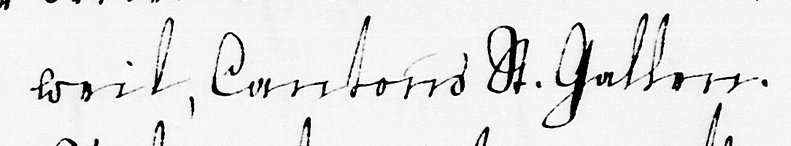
weil, Cantons St. Gallen.
